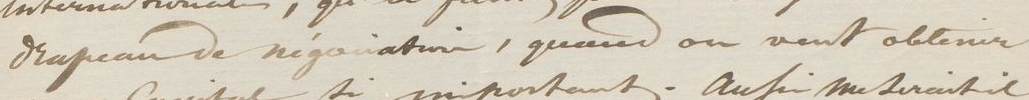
drapeau de négociation, quand on veut obtenir
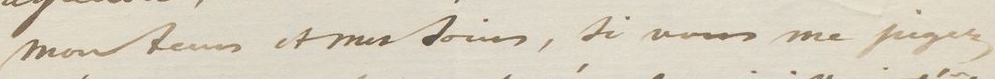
mon tems et mes soins, si vous me jugez
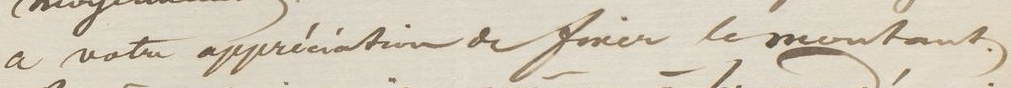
à votre appréciation de fixer le montant.
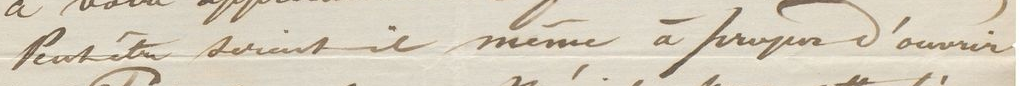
Peut-être serait-il même à propos d'ouvrir
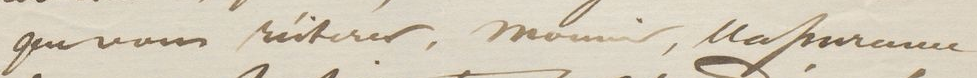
que vous réiterer, Monsieur, l'assurance
